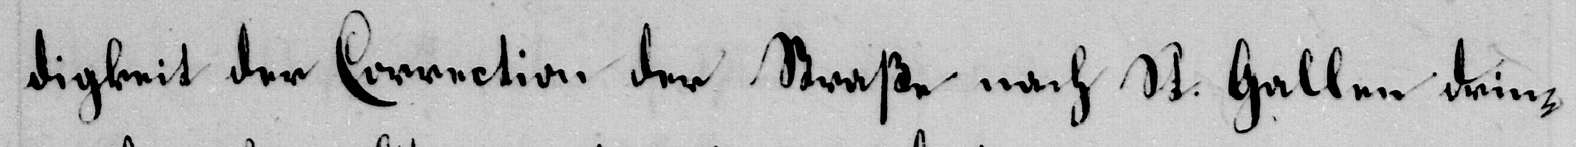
digkeit der Correction der Straße nach St. Gallen drin¬
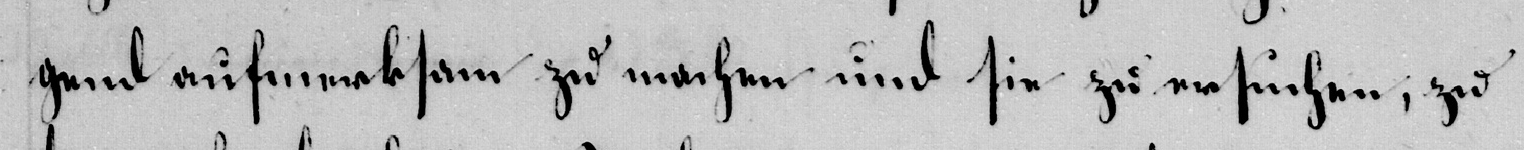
gend aufmerksam zu machen und sie zu ersuchen, zu
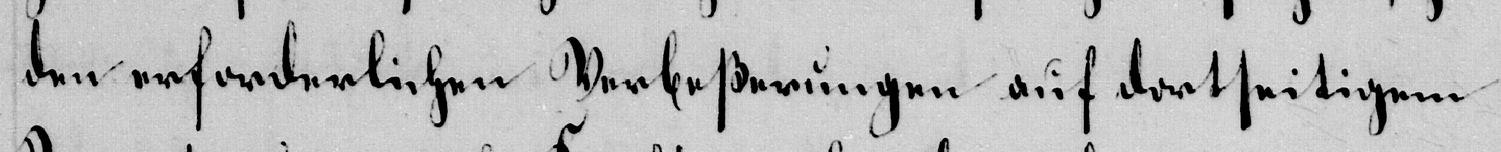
den erforderlichen Verbeßerungen auf dortseitigem
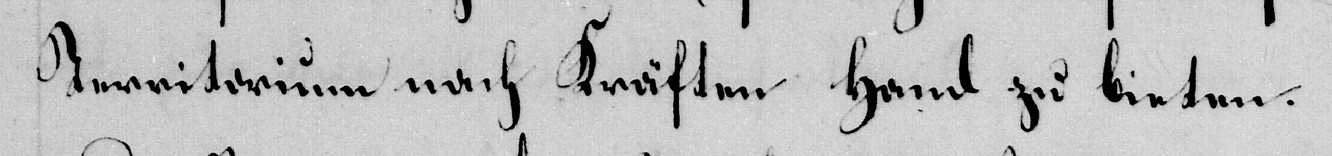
Territorium nach Kräften Hand zu bieten.
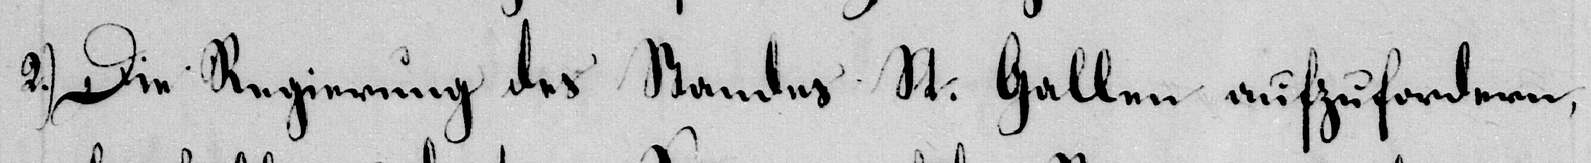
2.) Die Regierung des Standes St. Gallen aufzufordern,
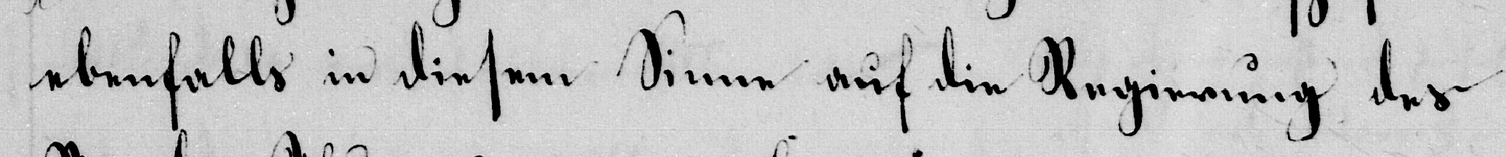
ebenfalls in diesem Sinne auf die Regierung des
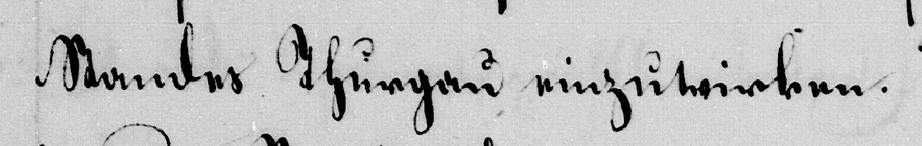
Standes Thurgau einzuwirken.
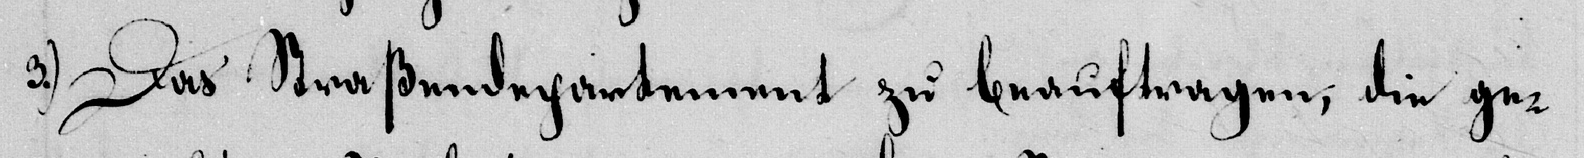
3.) Das Straßendepartement zu beauftragen, die ge¬
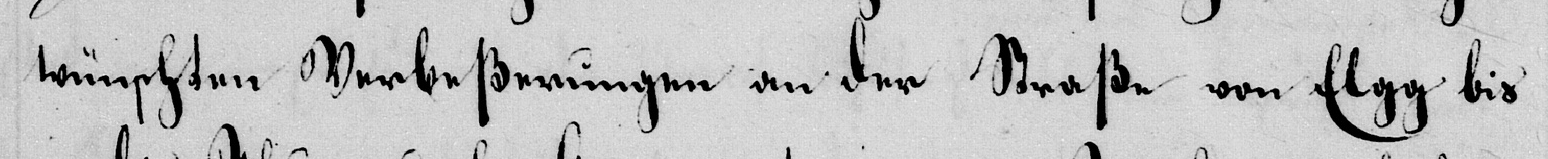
wünschten Verbeßerungen an der Straße von Elgg bis
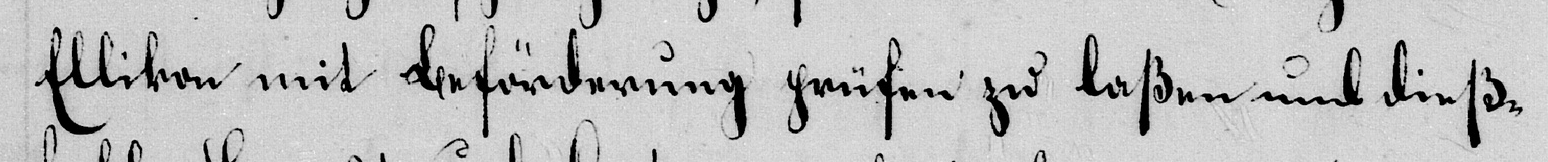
Ellikon mit Beförderung prüfen zu laßen und dieß¬
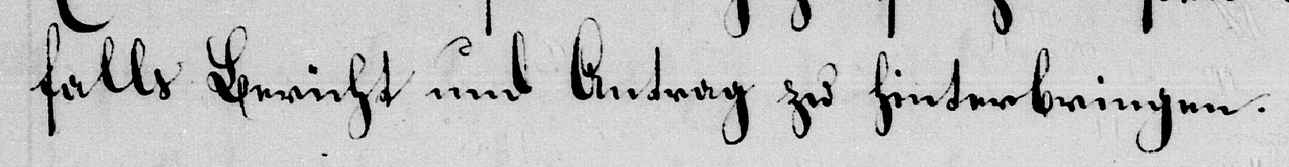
falls Bericht und Antrag zu hinterbringen.
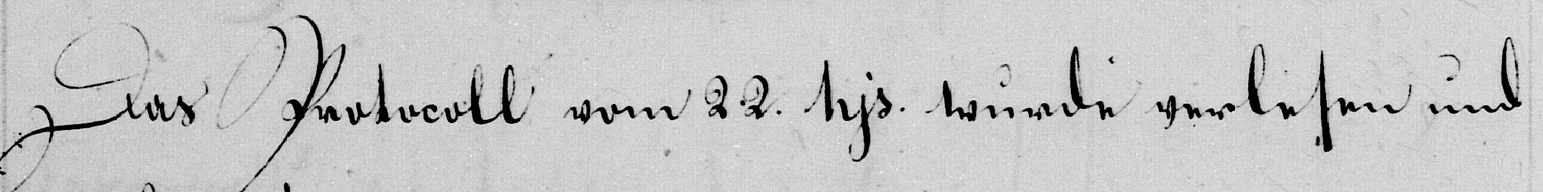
Das Protocoll vom 22. hjs. wurde verlesen und
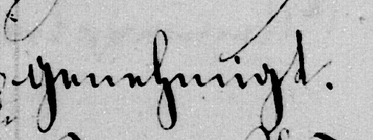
genehmigt.
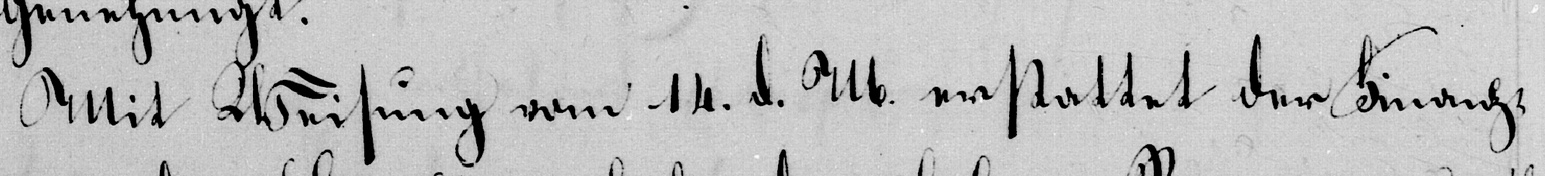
Mit Weisung vom 14. d. M. erstattet der Finanz¬
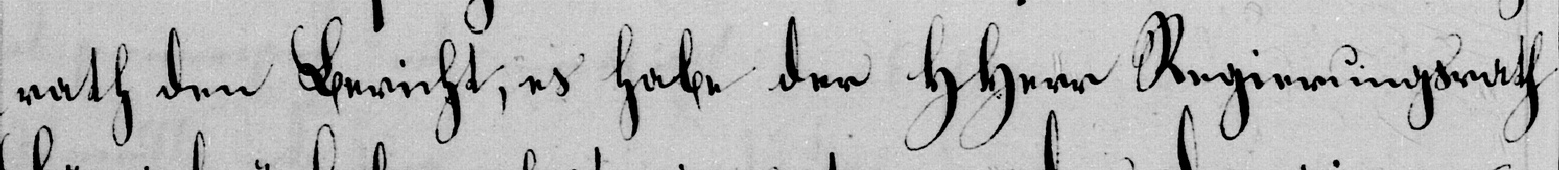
rath den Bericht, es habe der HHerr Regierungsrath
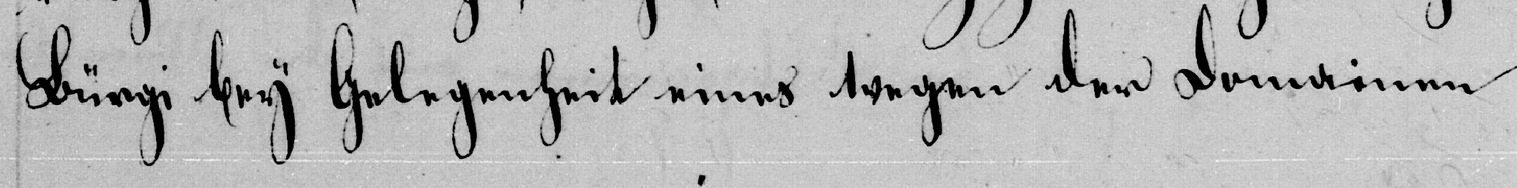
Bürgi bey Gelegenheit eines wegen der Domainen
